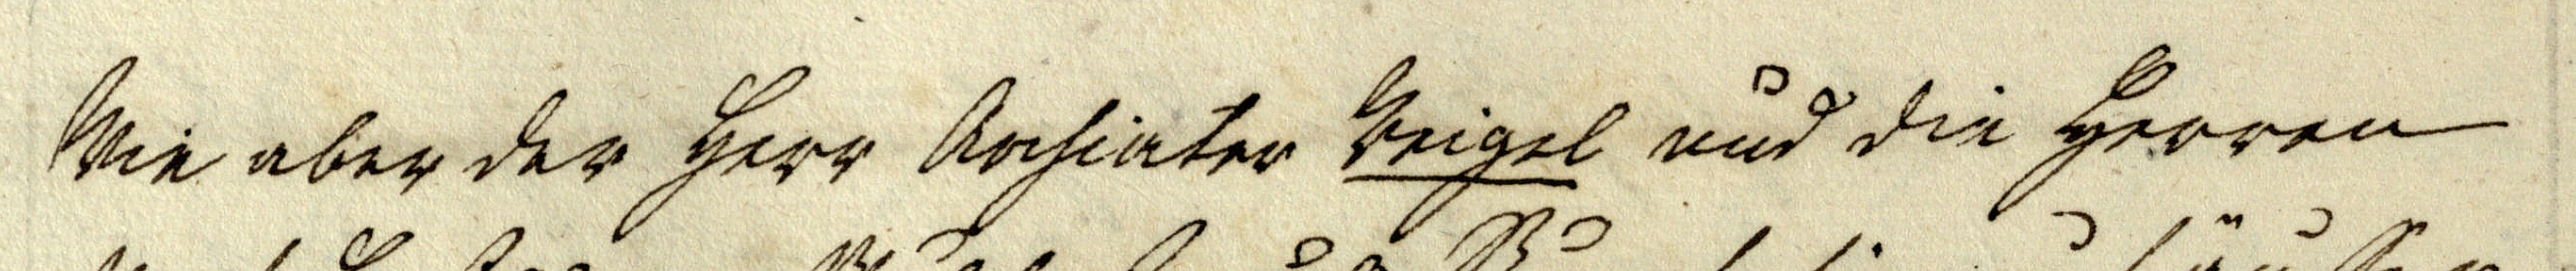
Wie aber der Herr Archiater Weigel und die Herren
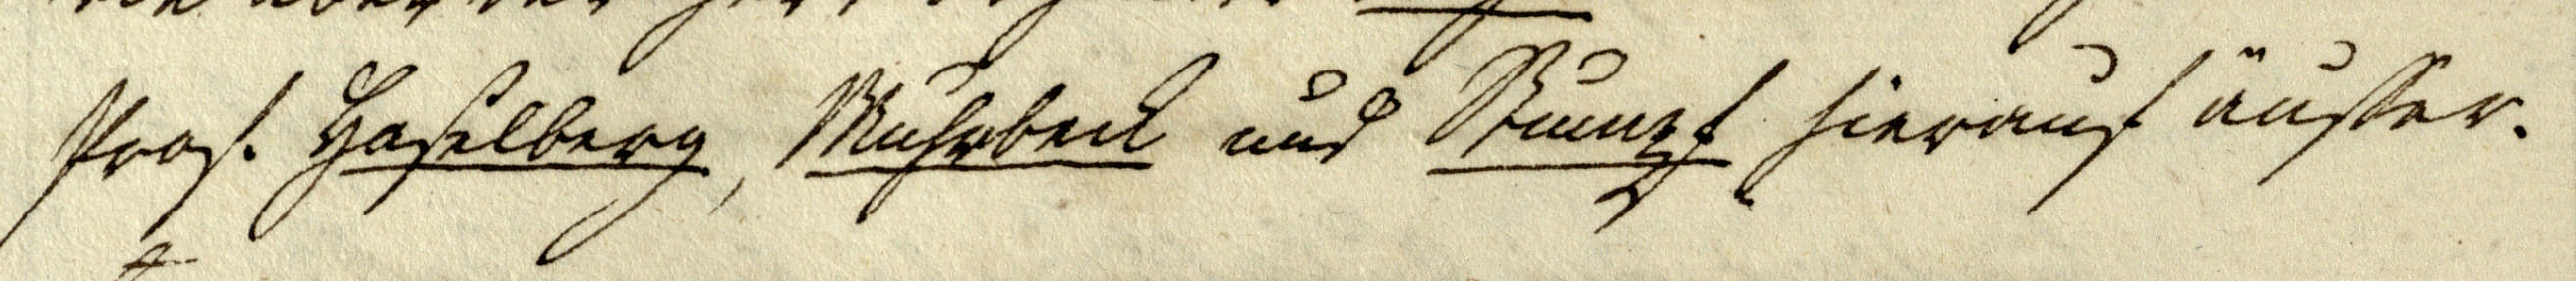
Prof. Haselberg, Muhrbeck und Stumpf hierauf äusser¬
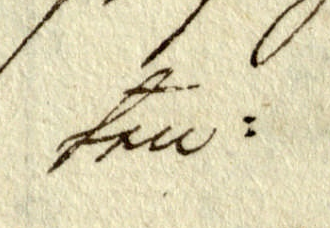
ten:
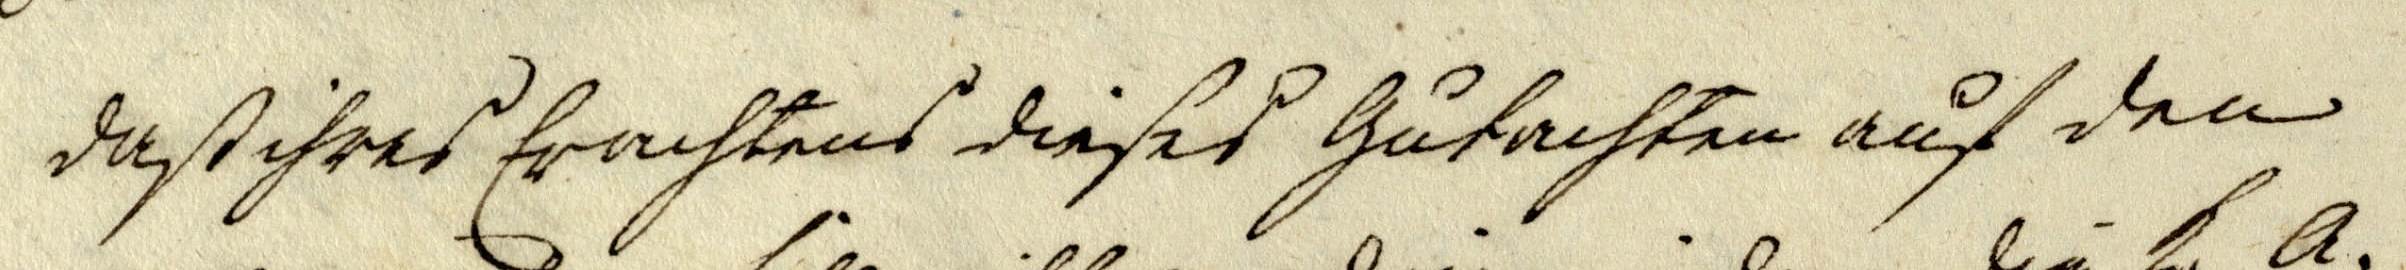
daß ihres Erachtens dieses Gutachten auf den
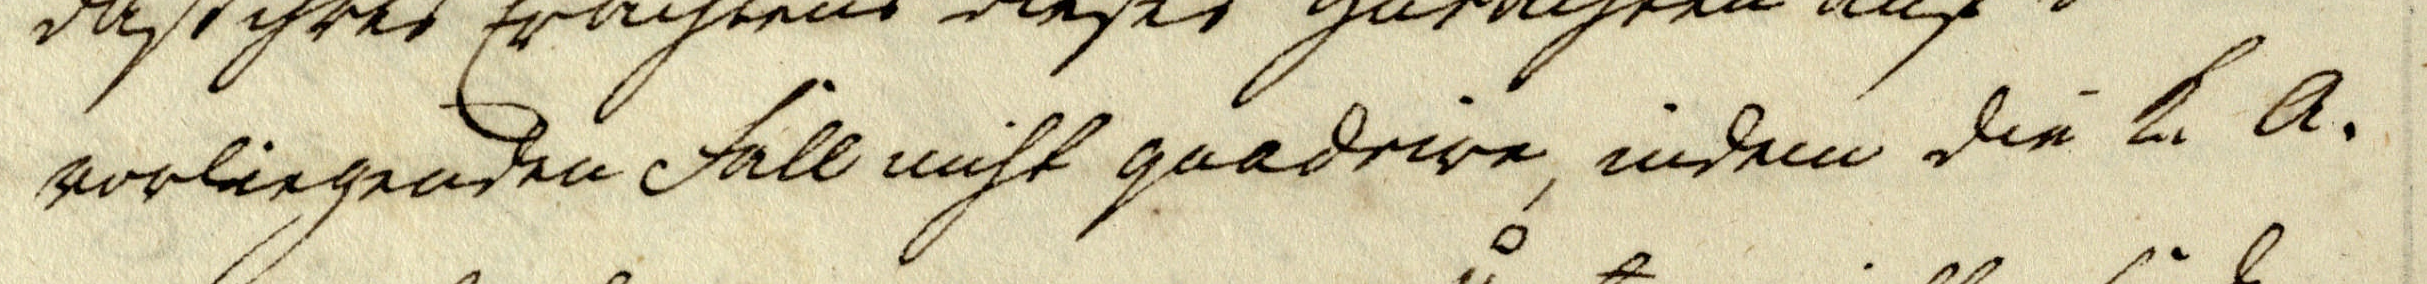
vorliegenden Fall nicht quadrire, indem die K. A.
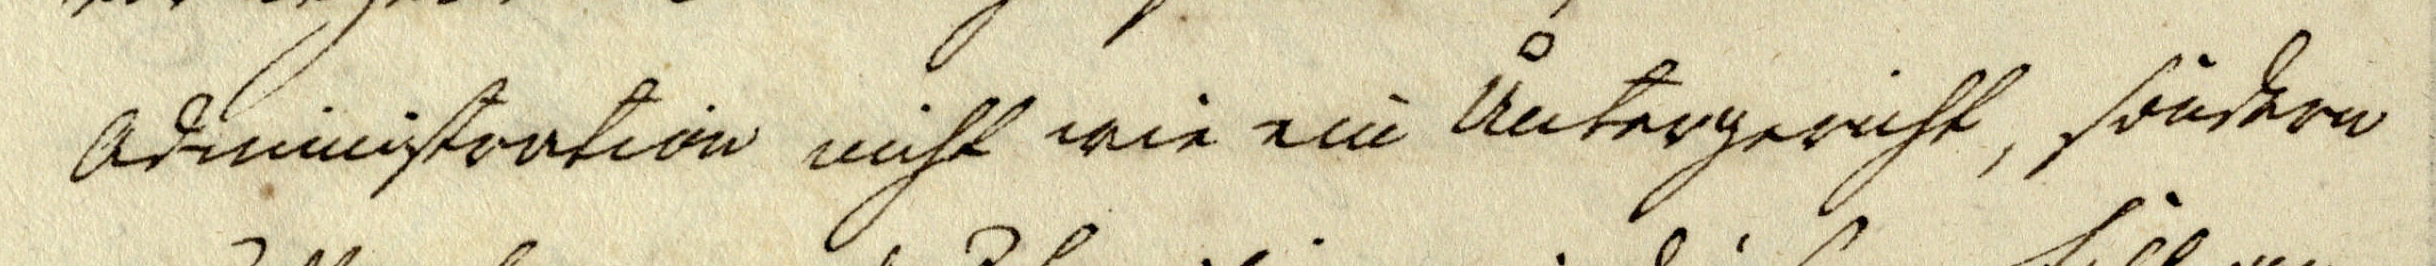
Administration nicht wie ein Untergericht, sondern
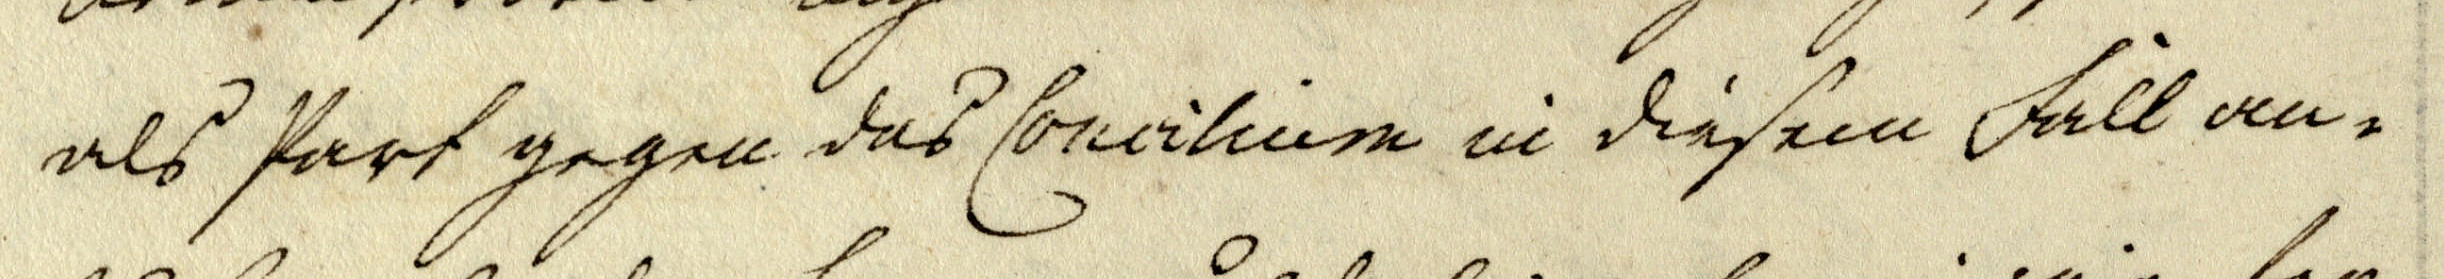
als Part gegen das Concilium in diesem Fall an¬
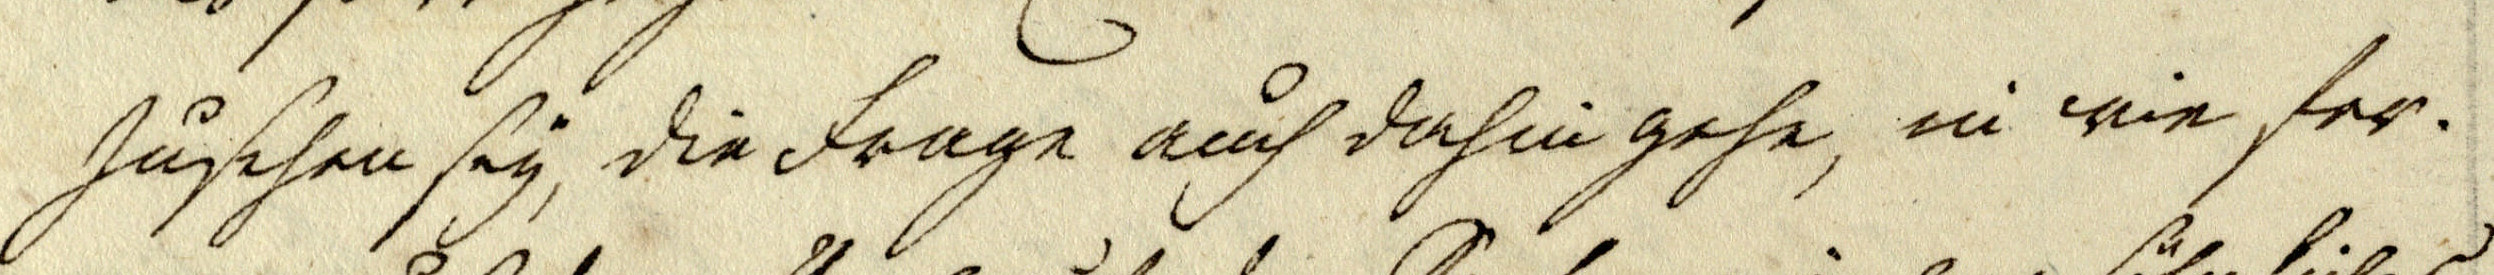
zusehen seÿ, die Frage auch dahin gehe, in wie fer¬
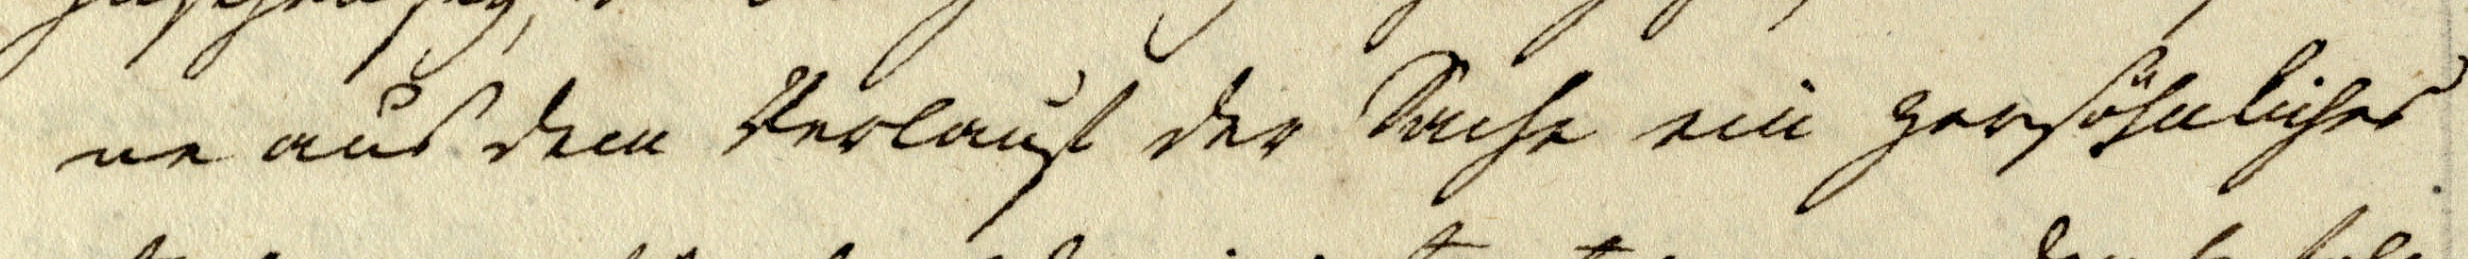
ne aus dem Verlauf der Sache ein persöhnliches
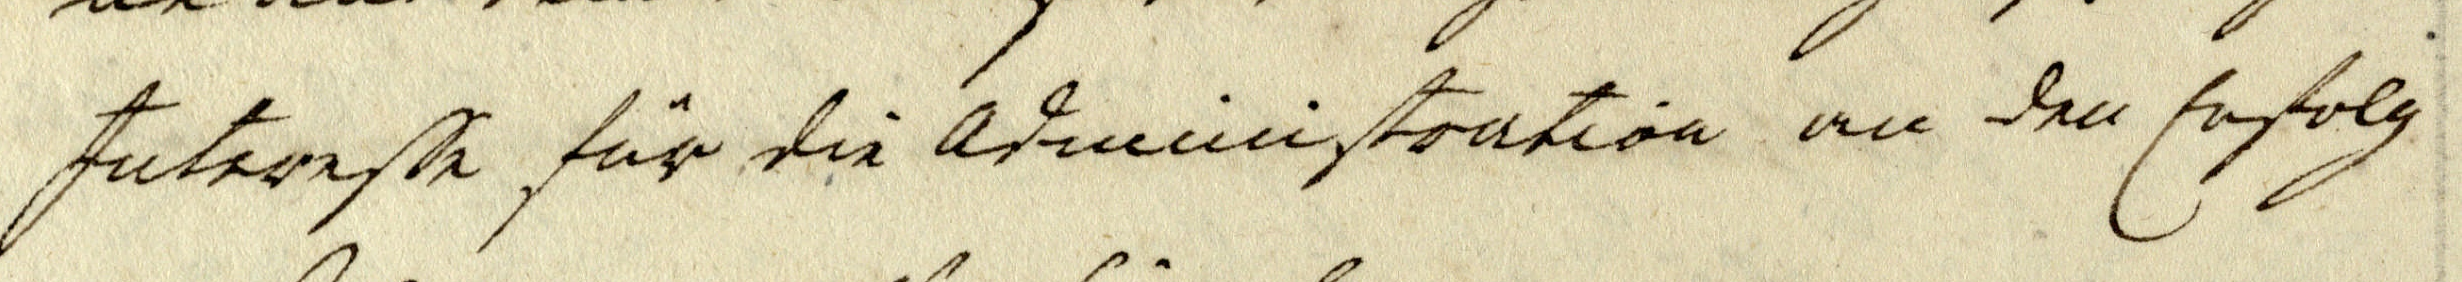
Interesse für die Administration an den Erfolg
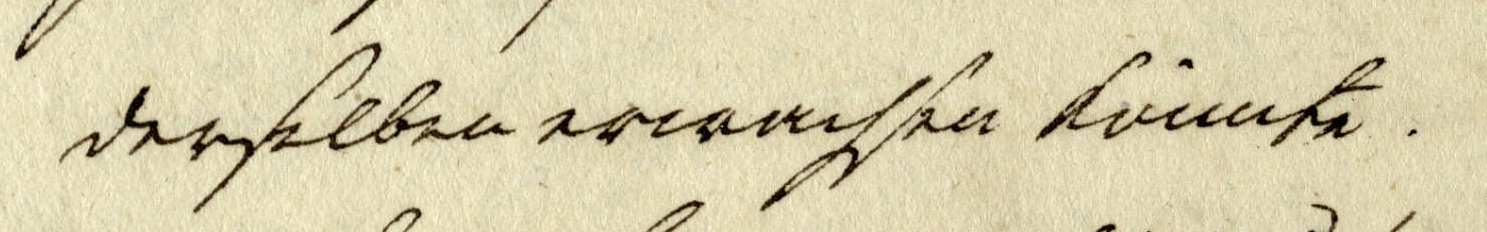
derselben erwachsen könnte.
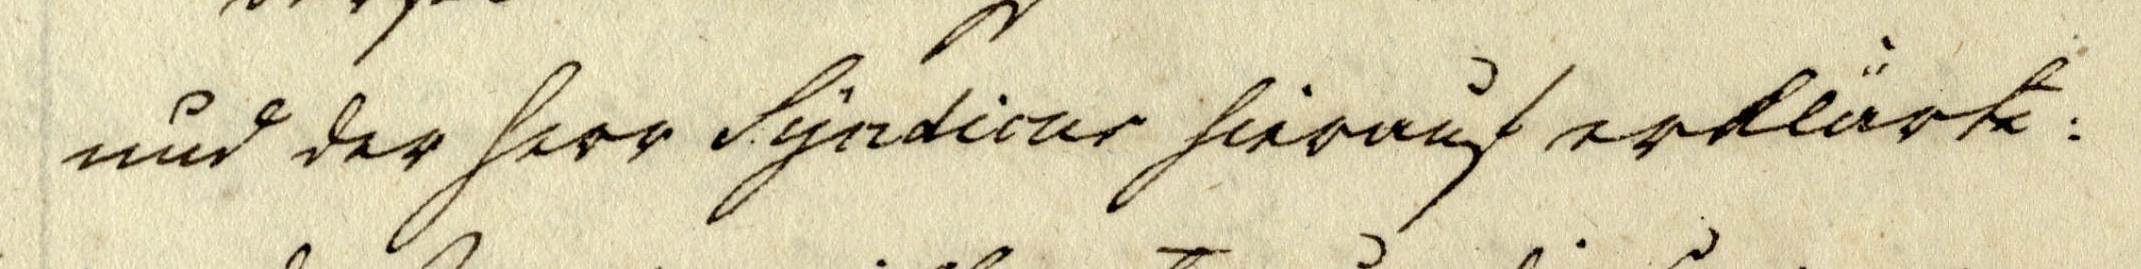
und der Herr Sÿndicus hierauf erklärte:
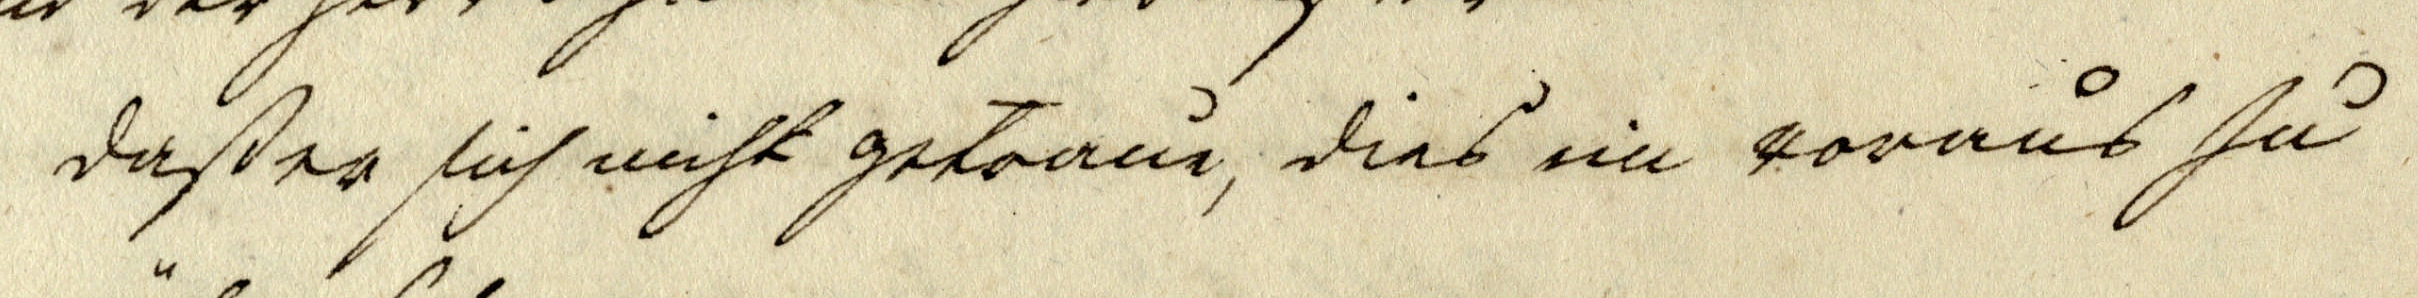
daß er sich nicht getraue, dies im voraus zu
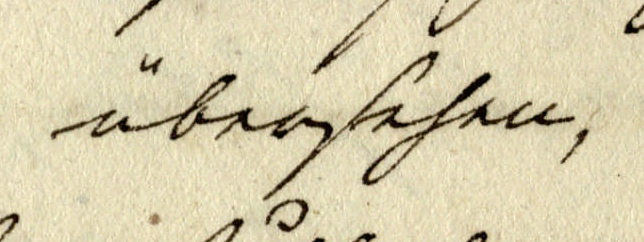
übersehen,
